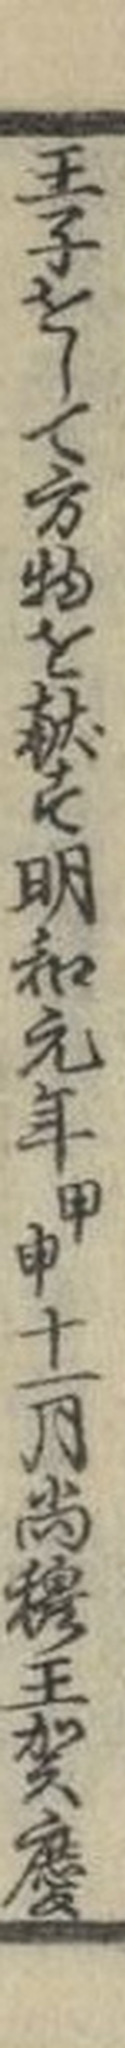王子をして方物を献す明和元年甲申十一月尚穆王賀慶
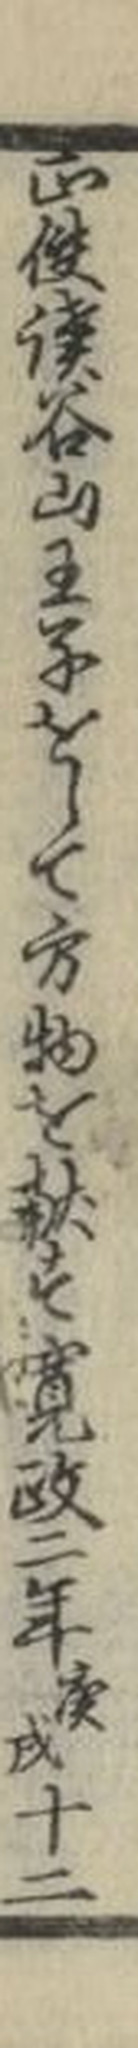正使読谷山王子をして方物を献す寛政二年庚戌十二
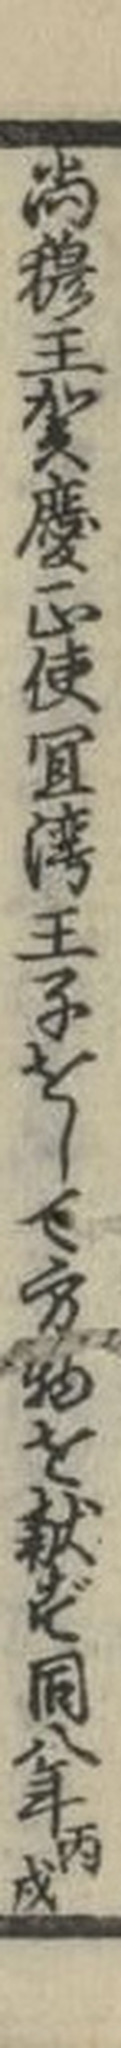尚穆王賀慶正使宜湾王子をして方物を献ず同八年丙戌

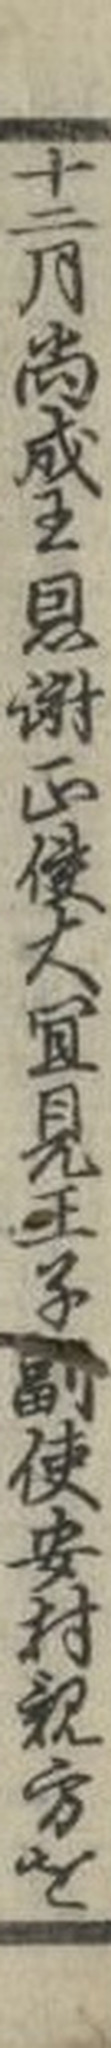十二月尚成王恩謝正使大宜見王子副使安村親方を
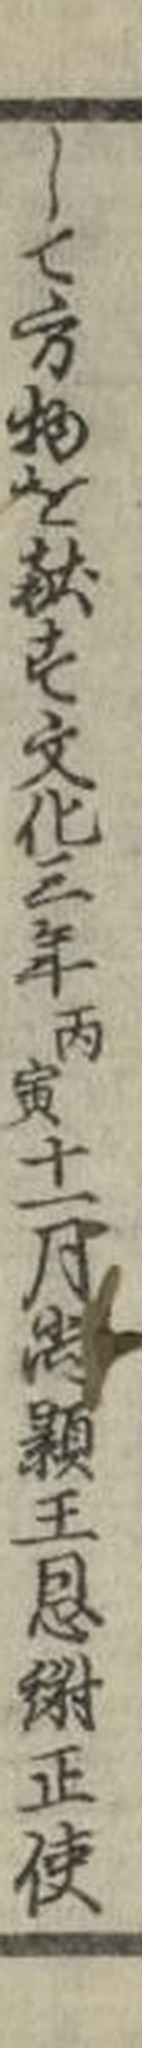して方物を献す文化三年丙寅十一月尚顥王恩謝正使
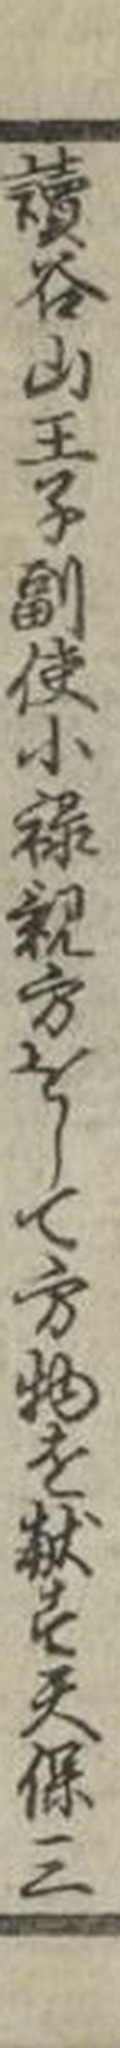読谷山王子副使小禄親方をして方物を献す天保三
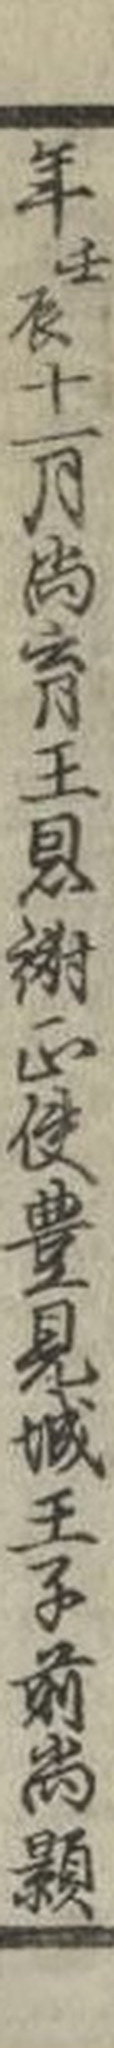年壬辰十一月尚育王恩謝正使豊見城王子前尚顥
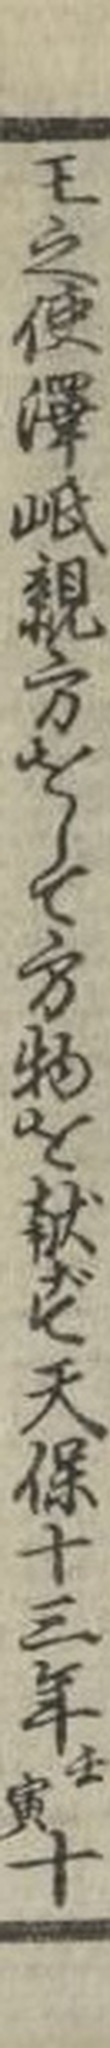王之使澤岻親方をして方物を献ず天保十三年壬寅十
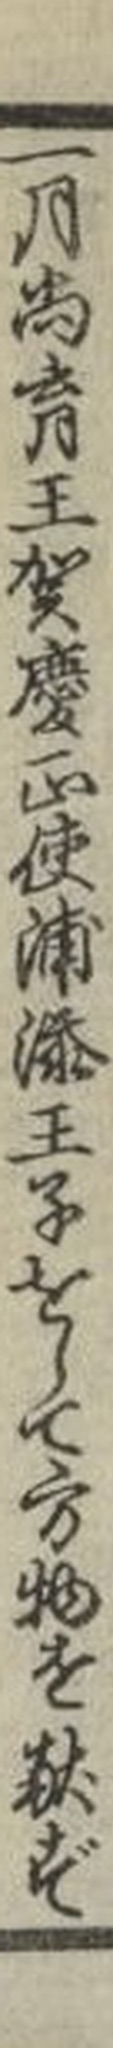一月尚育王賀慶正使浦添王子をして方物を献ず
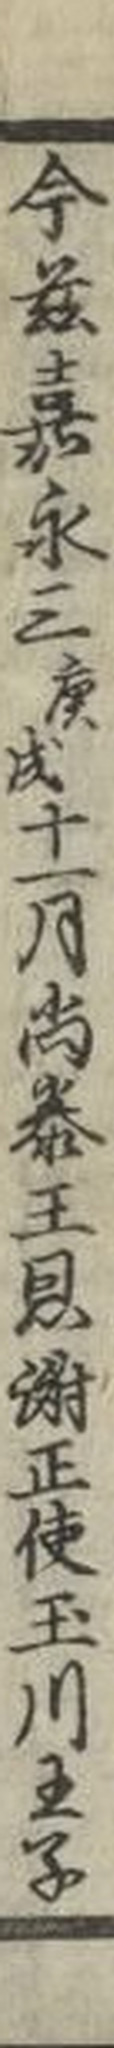今茲嘉永三庚戌十一月尚泰王恩謝正使玉川王子
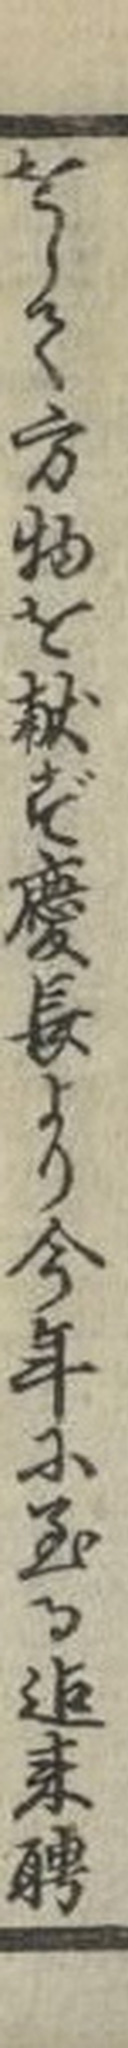をして方物を献ず慶長より今年に至る迠来聘
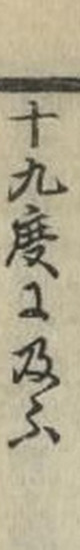十九度に及ふ
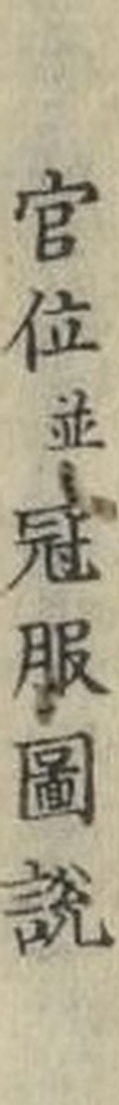官位並冠服図説
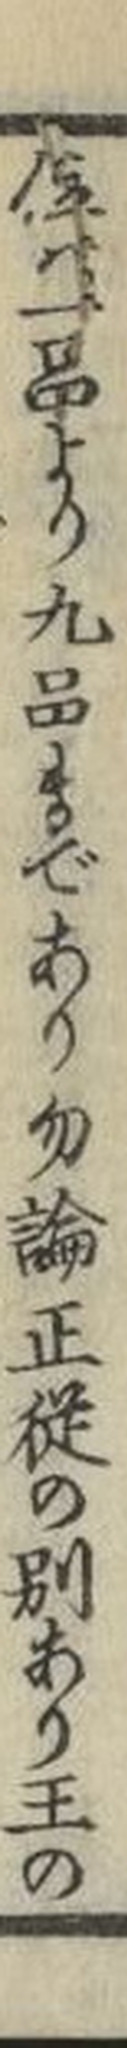位は一品より九品まであり勿論正従の別あり王の
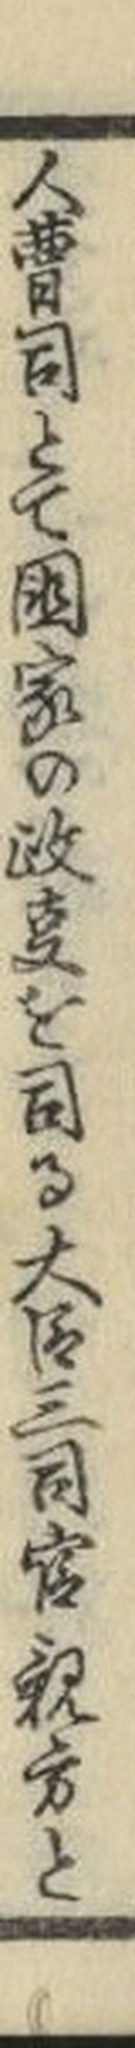人曹司とて国家の政事を司る大臣三司官親方と
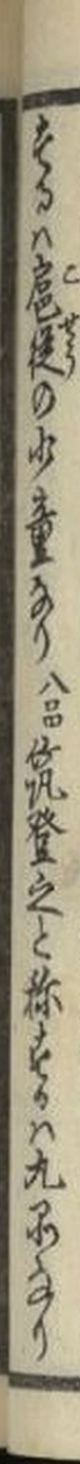するは扈従の少童なり八品筑登之と称するは九品なり
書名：琉球解語
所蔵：University of the Ryukyus Library
